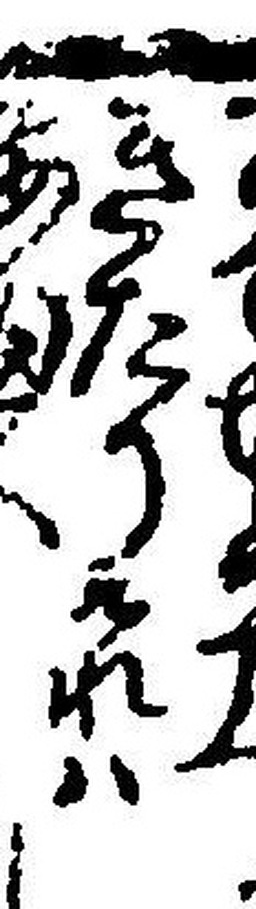きたりけれは
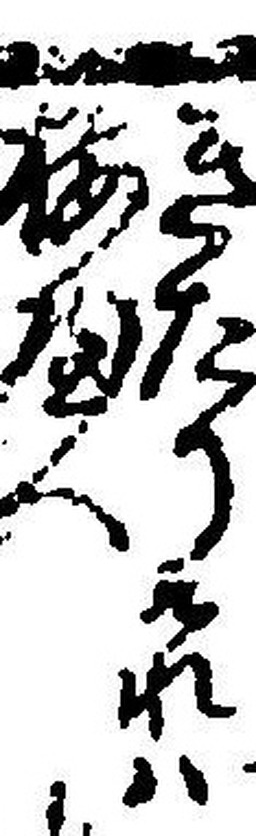梅屋へ
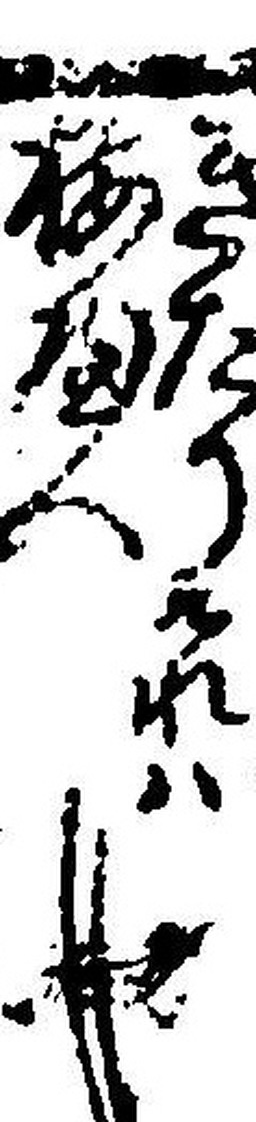梅屋へ
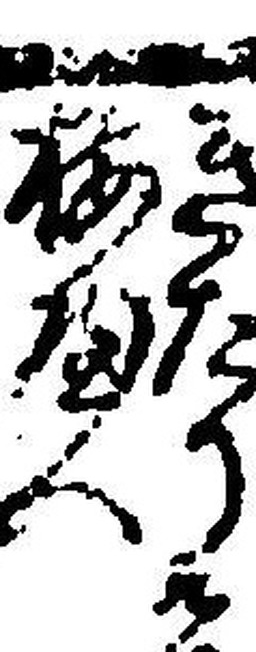梅屋へ
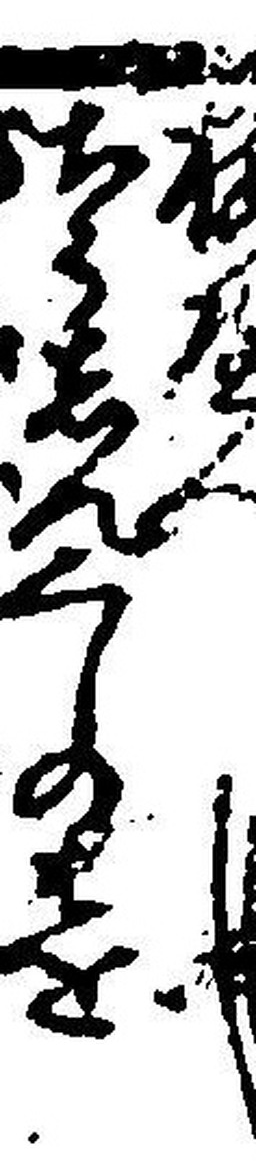ちうしんくしのはを
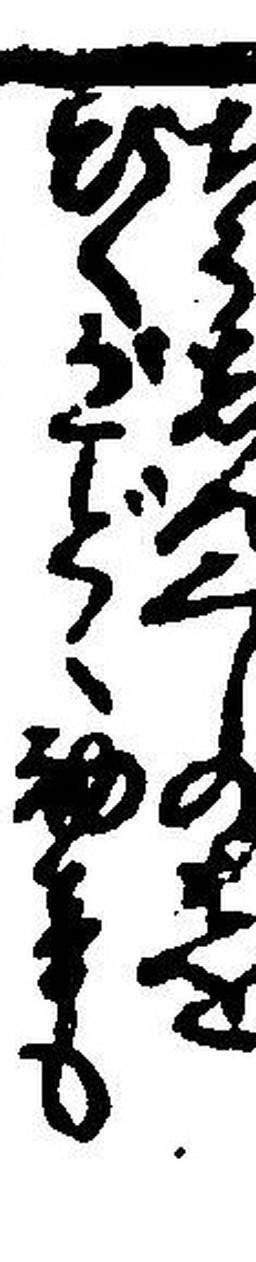ひくがごとく初音も
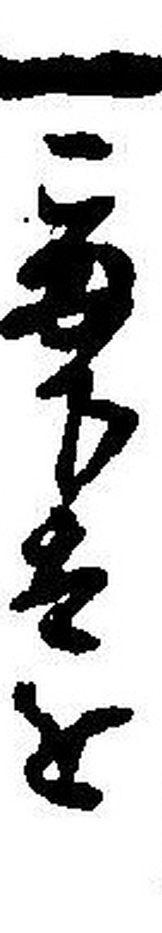こま下太を
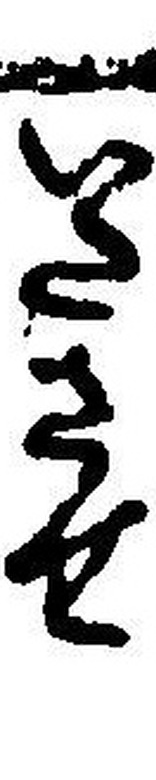いたさせ
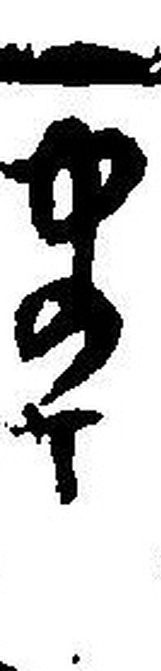中の丁
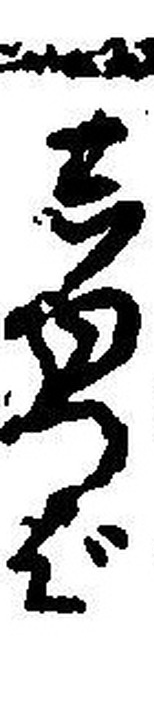しゆつば
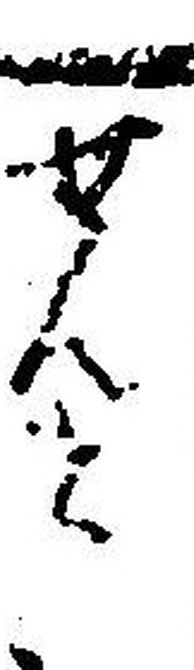せんと
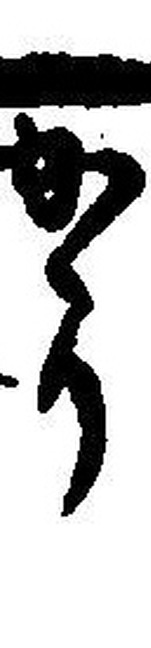かゝり
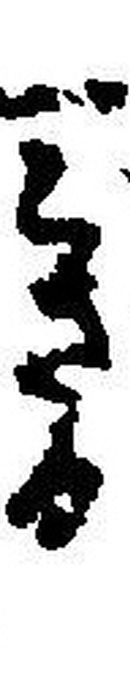ござる
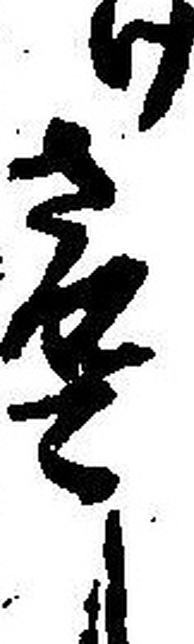させて
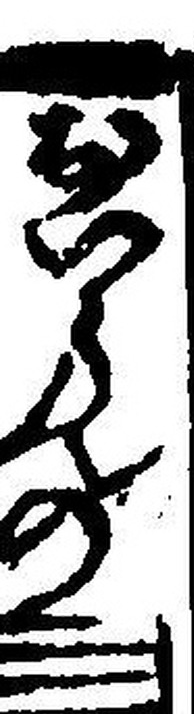おいらんの
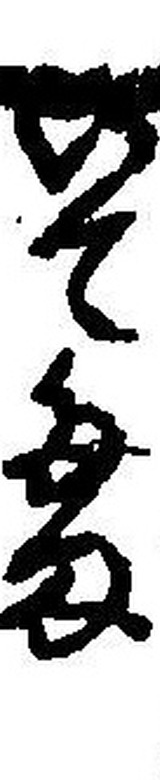いてたま
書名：間違狐之女郎買 / 市場通笑作
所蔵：東京大学総合図書館 General Library in the University of Tokyo, JAPAN
